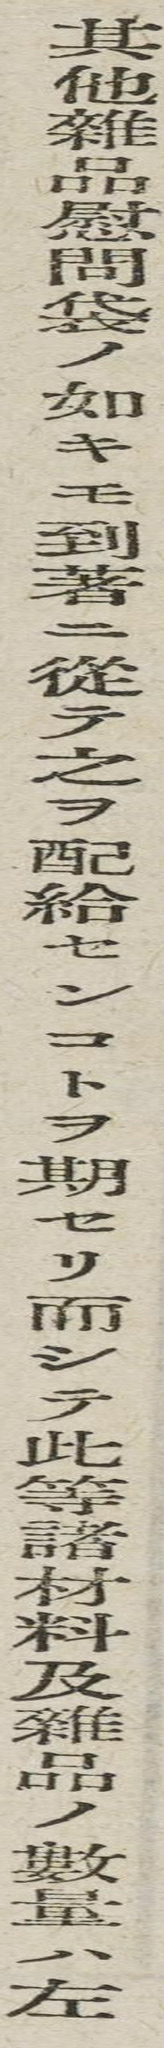其他雑品慰問袋ノ如キモ到着ニ従テ之ヲ配給センコトヲ期セリ而シテ此等緒材料及雑品ノ数量ハ左
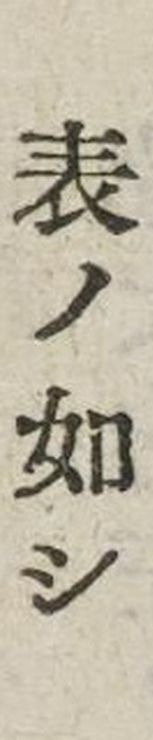表ノ如シ
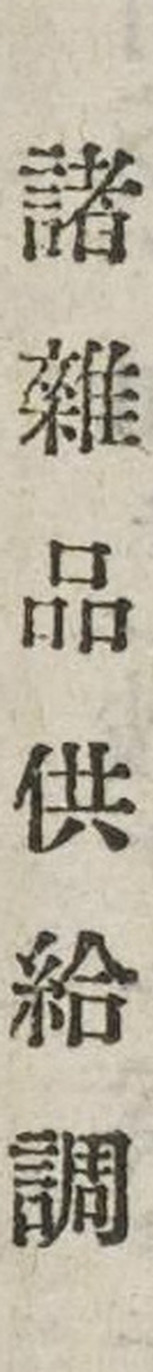諸雑品供給調
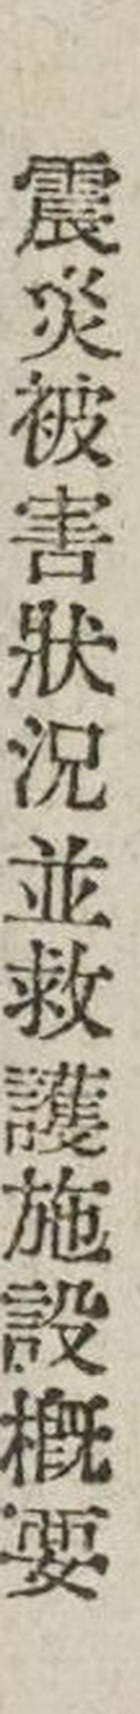震災被害状況並救護施設概要

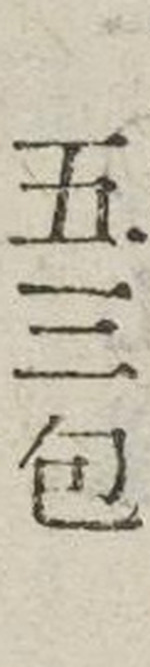五三包
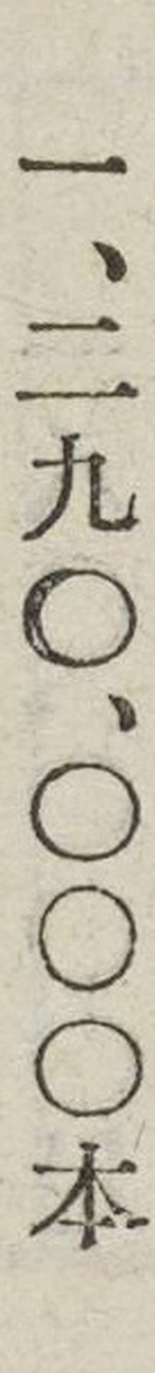茣蓙二二〇、〇〇〇枚
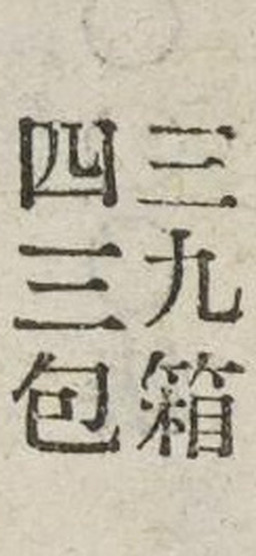四三包
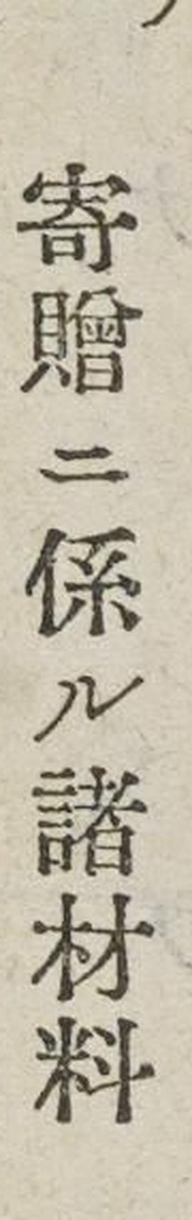寄贈ニ係ル諸材料
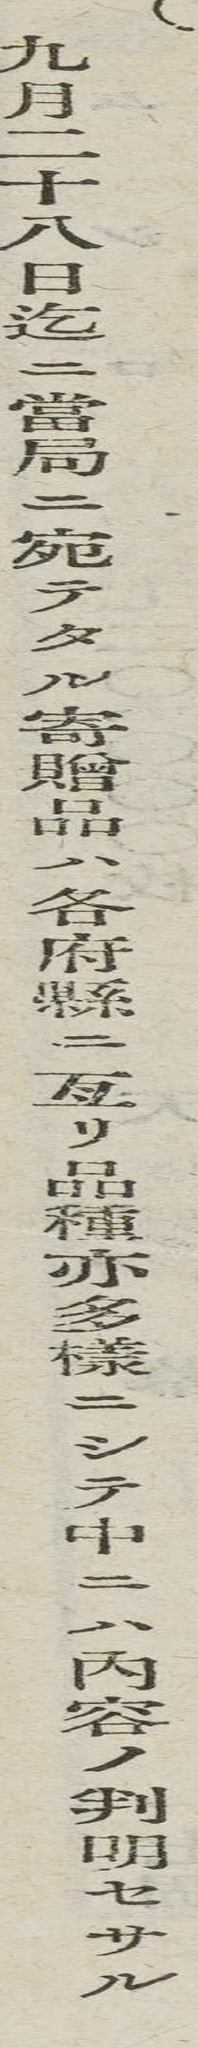九月二十八日迄ニ当局ニ宛テタル寄贈品ハ各府県ニ互リ品種亦多様ニシテ中ニハ内容ノ判明セサル
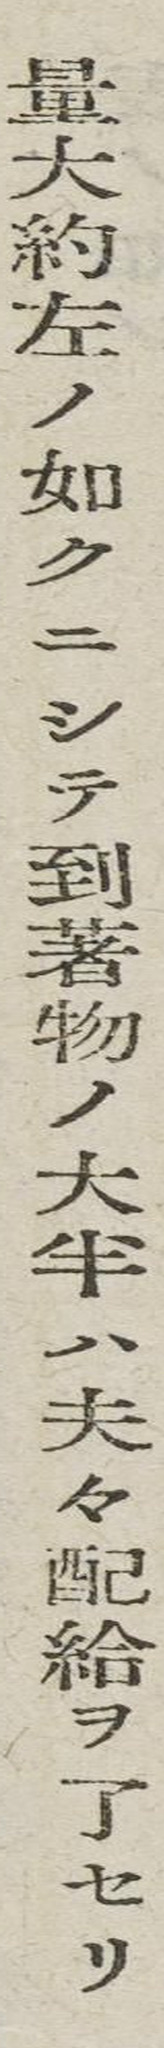量大約左ノ如クニシテ到着物ノ大半ハ夫々配給ヲ了セリ
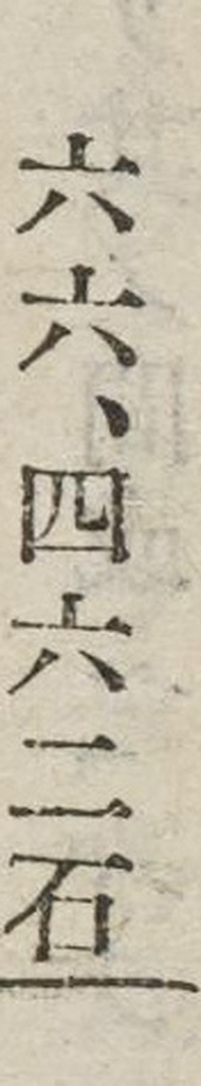木材六六、四六二石
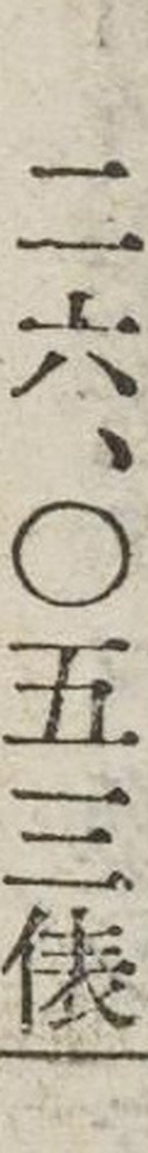木炭二六、〇五三俵
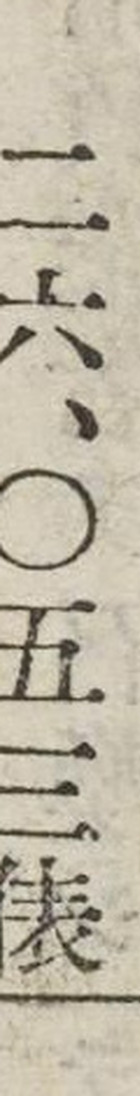木炭二六、〇五三俵
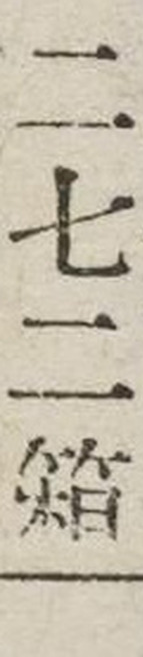二七二箱
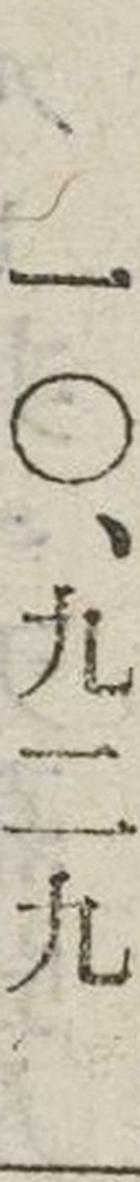一〇、九二九
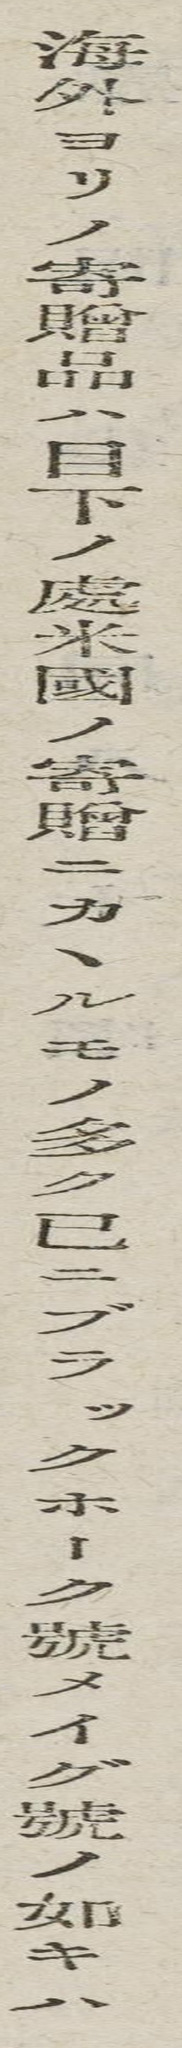海外ヨリノ寄贈品ハ目下ノ処米国ノ寄贈ニカヽルモノ多ク已ニブラックホーク号メイグ号ノ如キハ
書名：震災被害状況並救護施設概要
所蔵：東京大学地震研究所図書室 Earthquake Research Institute Library, The University of Tokyo, JAPAN
